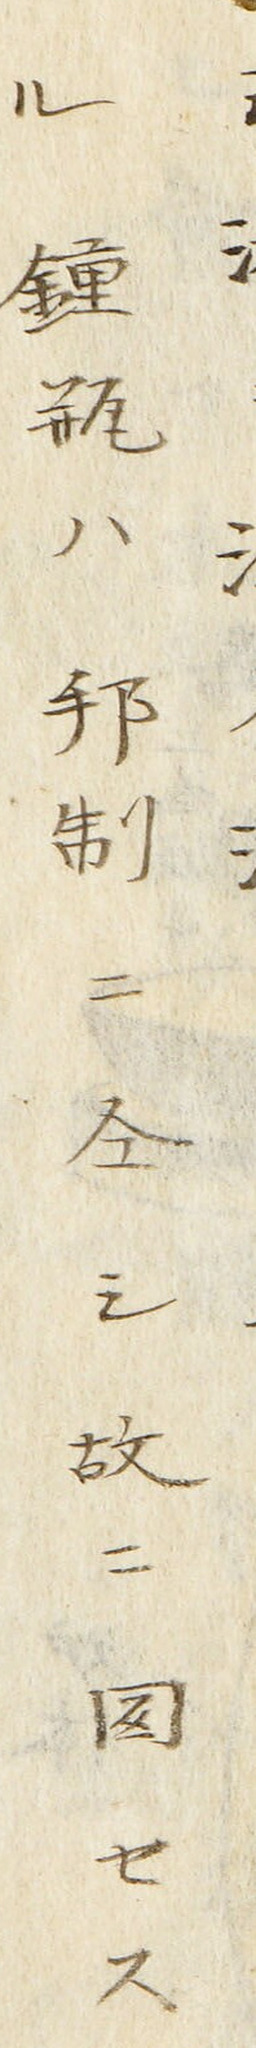ル鐘瓶ハ邦制ニ仝シ故ニ図セス

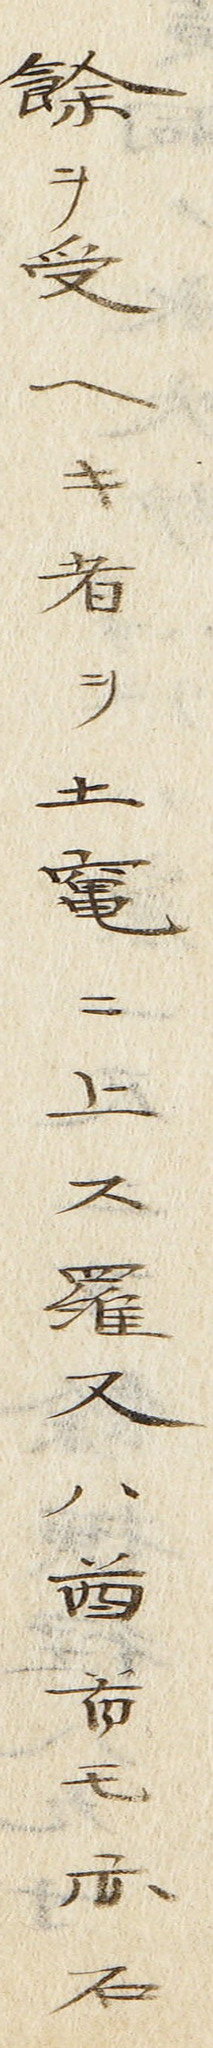余ヲ受ヘキ者ヲ土竃ニ上ス羅又ハ酋首モ亦石
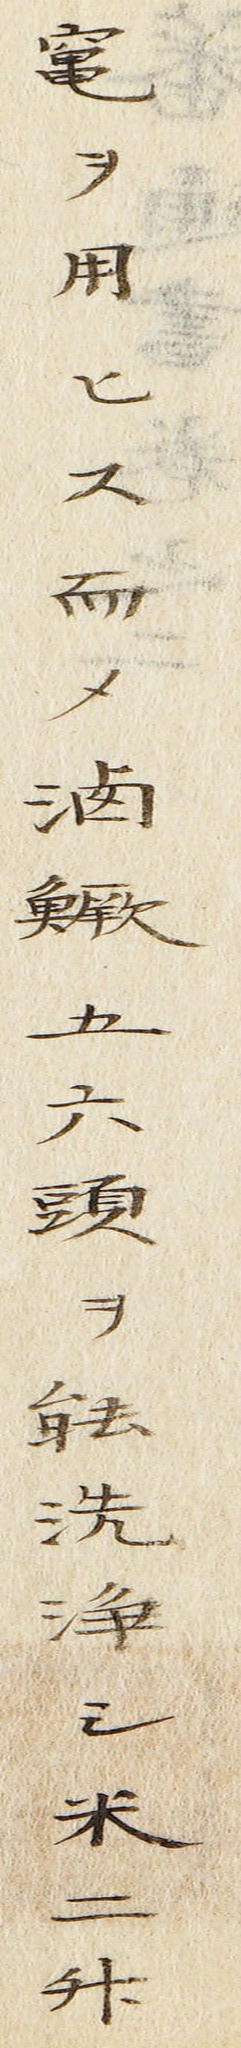竃ヲ用ヒス而シテ滷鱖五六頭ヲ能洗浄シ米二升
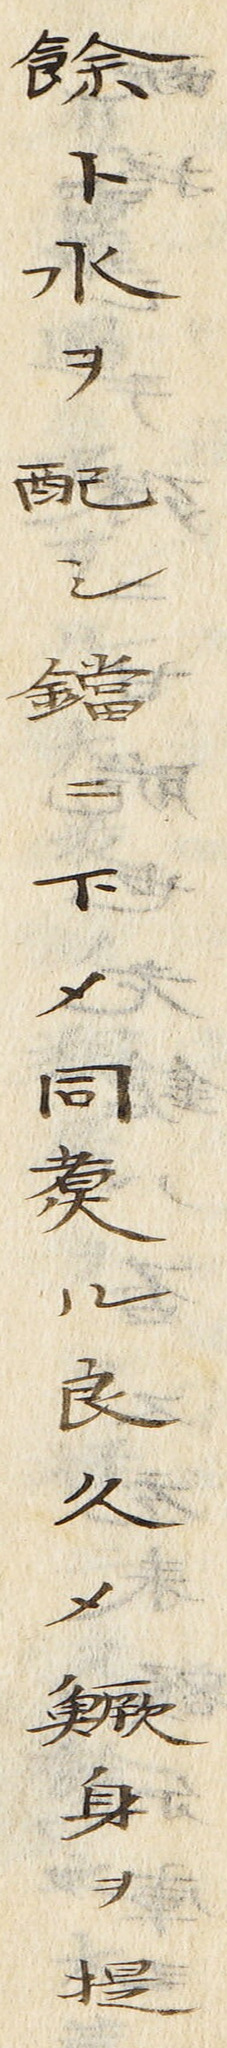余ト水ヲ配シ鐺ニ下シテ同煮ル良久シテ鱖身ヲ提
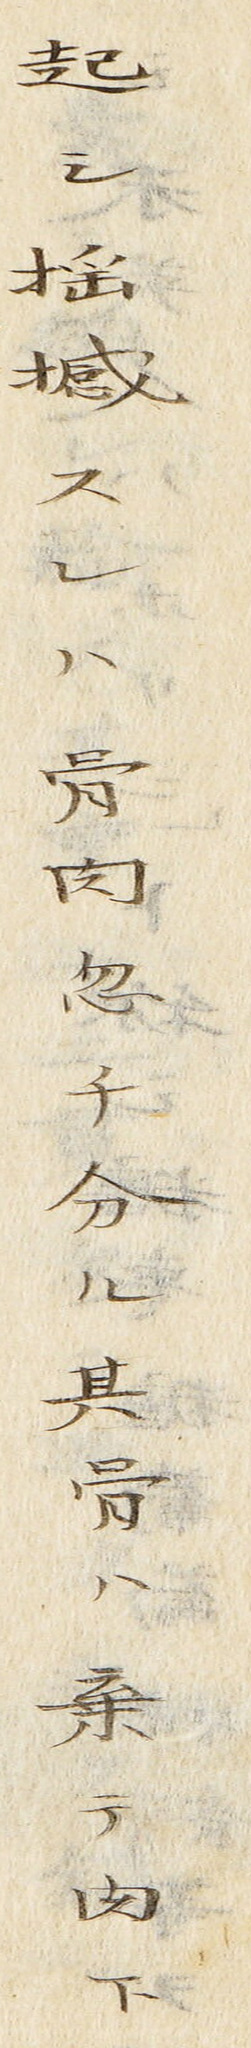起シ揺撼スレハ骨肉忽チ分ル其骨ハ棄テ肉下
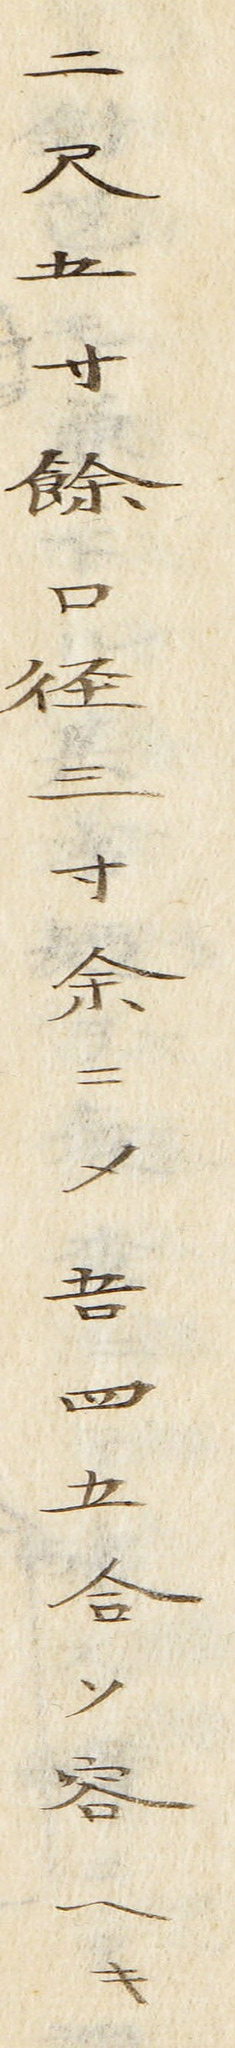二尺五寸余口径三寸余ニシテ吾四五合ソ容ヘキ
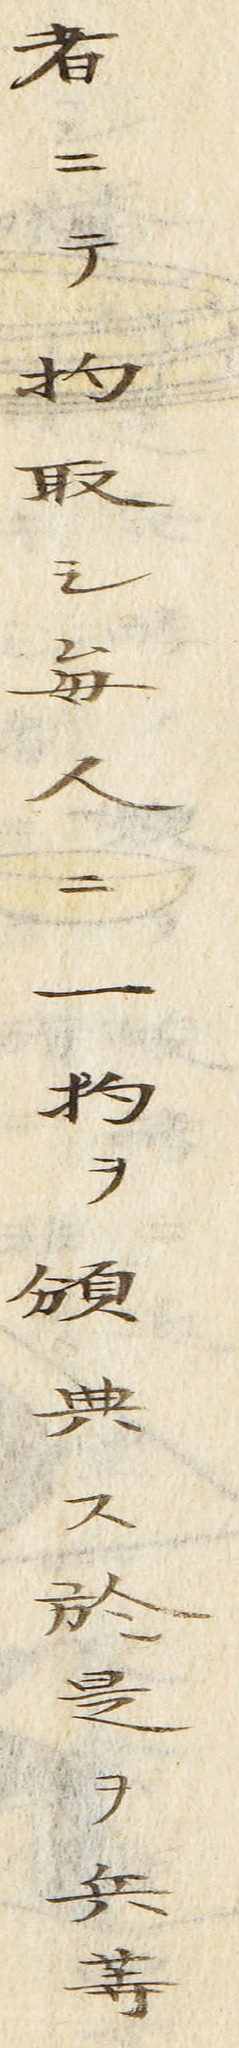者ニテ扚取シ毎人ニ一扚ヲ頒典ス於是ヲ兵等
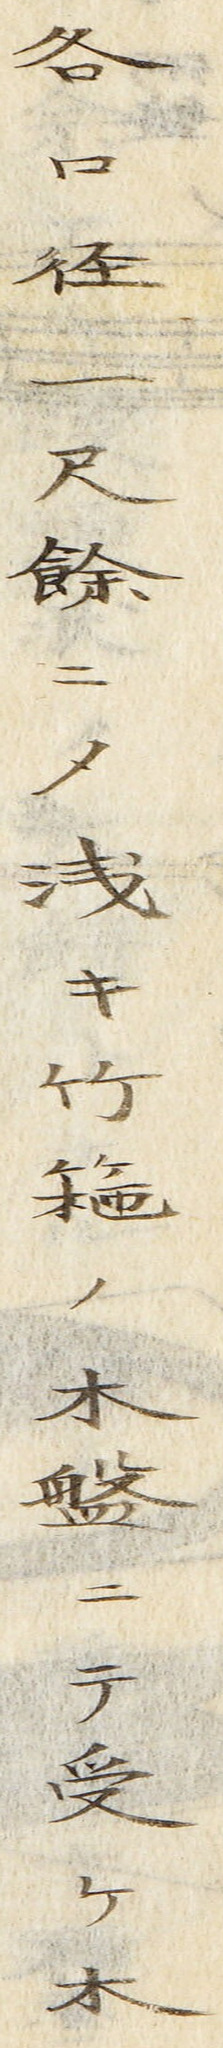各口径一尺余ニシテ浅キ竹箍ノ木盤ニテ受ケ木
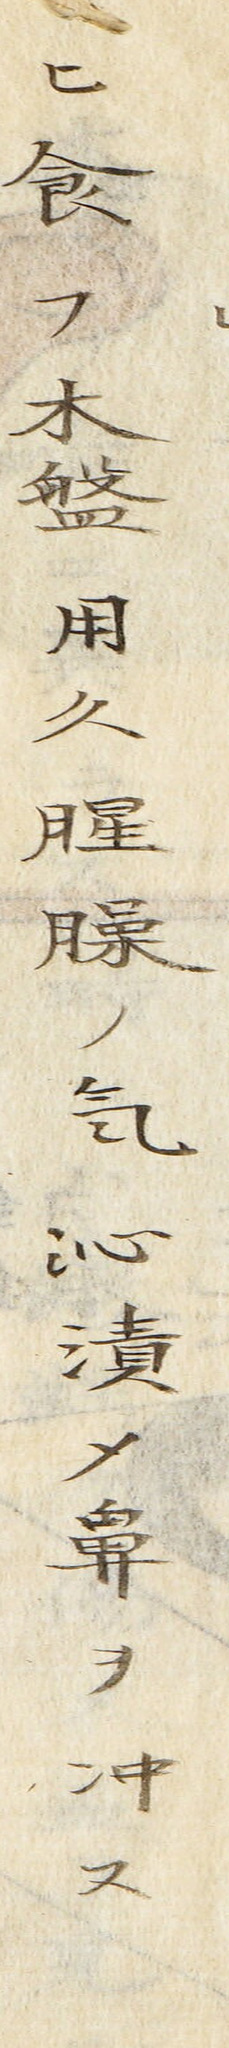ヒ食フ木盤用久腥臊ノ気沁漬シテ鼻ヲ冲ス

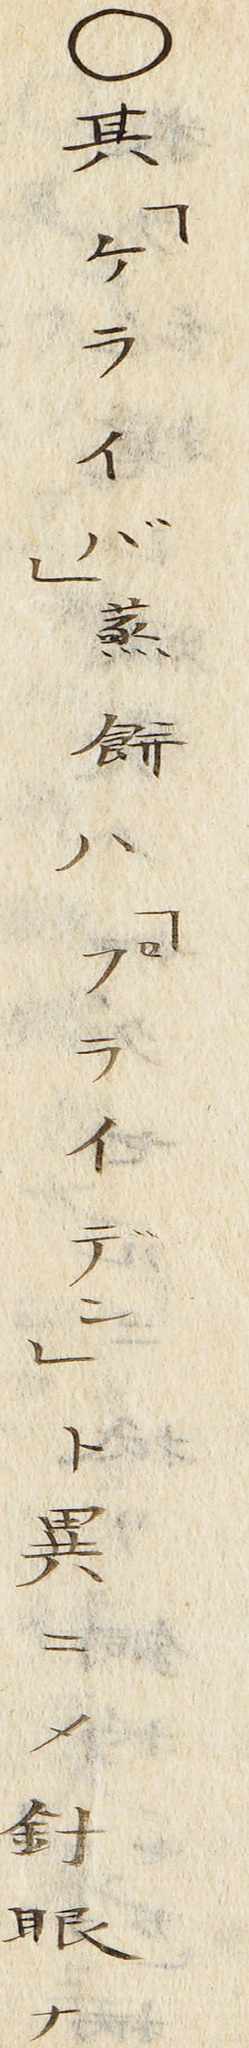○其「ケライバ」蒸餅ハ「プライデン」ト異ニシテ針眼ナ
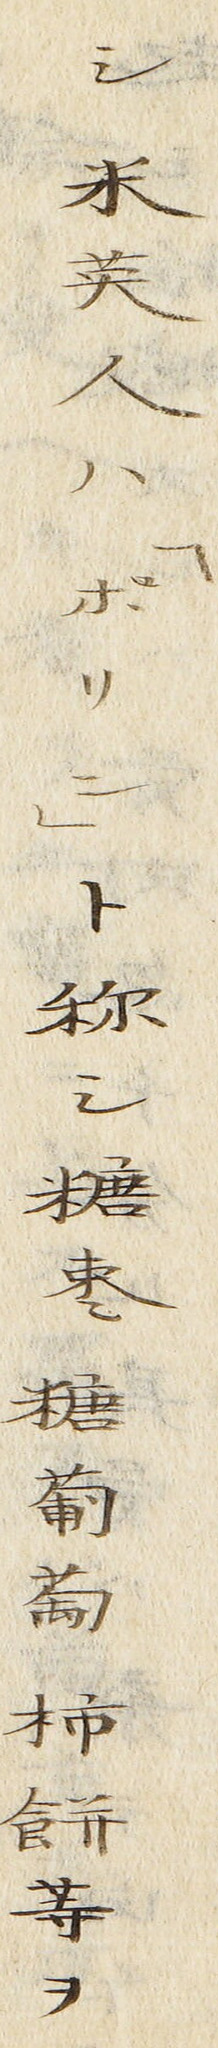シ米英人ハ「ポリン」ト称シ糖𣕤糖葡萄柿餅等ヲ
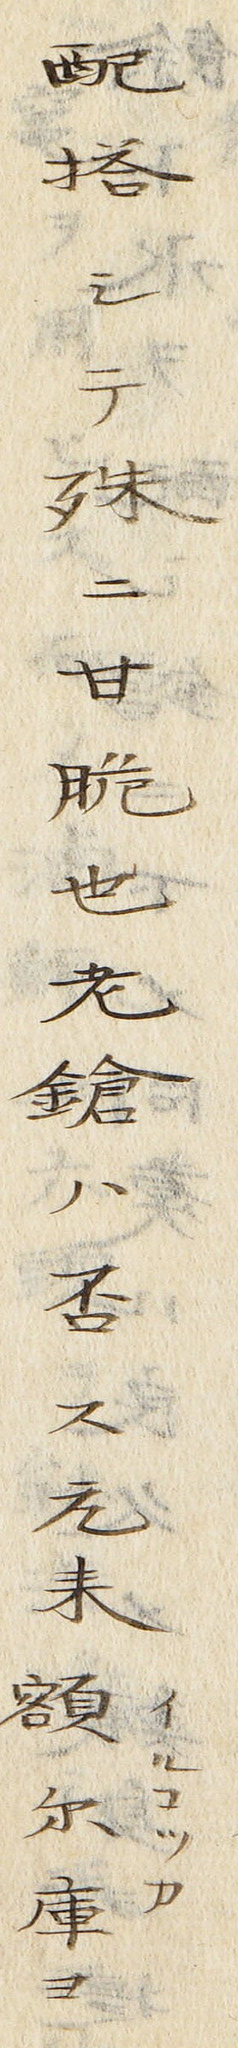配撘シテ殊に甘脆也老鎗ハ否ス元来額尓庫ヨ
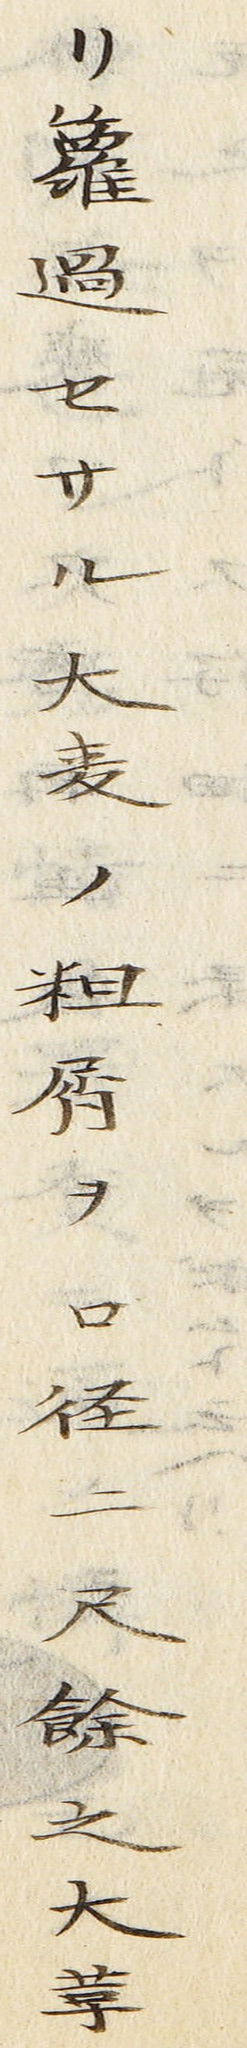リ籮過セサル大麦ノ粗屑ヲ口径二尺余之大革
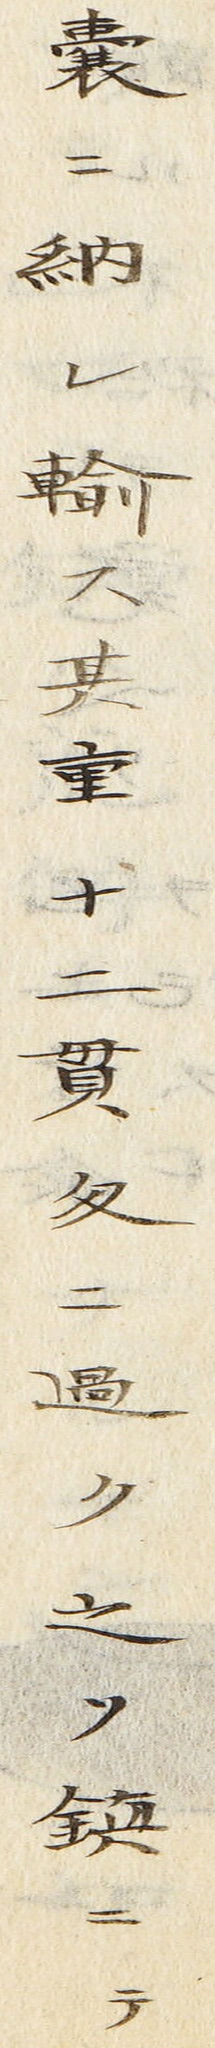嚢ニ納レ輸ス其重十二貫匁ニ過ク之ソ鎮ニテ
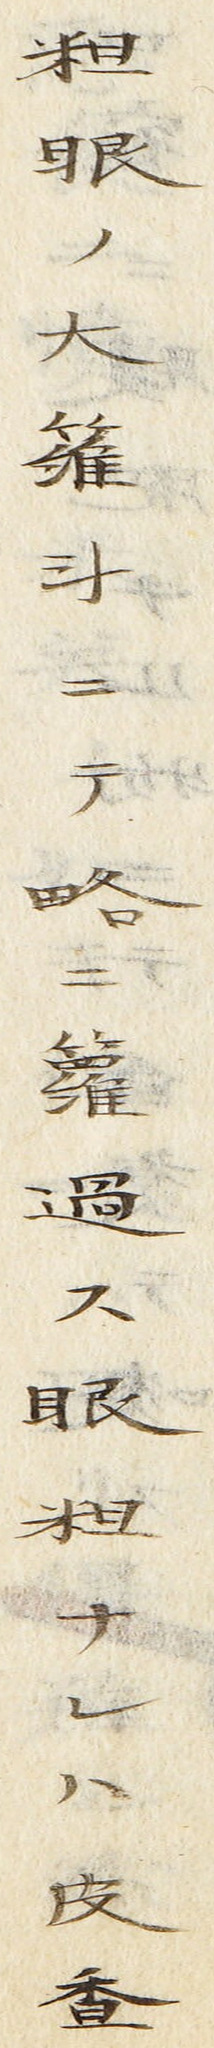粗眼ノ大斗ニテ略ニ籮過ス眼粗ナレハ皮𩠺
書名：流蕃通書
